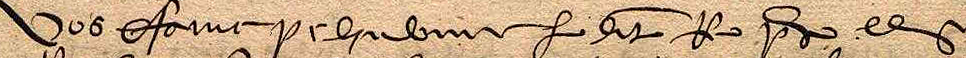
Vos e fama pedjndome ho dito Reo p̄so lhe
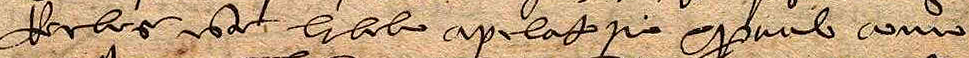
Recebese este ljbelo apelatorio e ꝓuado como
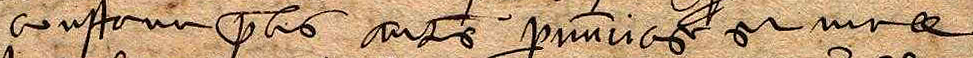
constaua p̄los autos ꝓnūciase ser mall
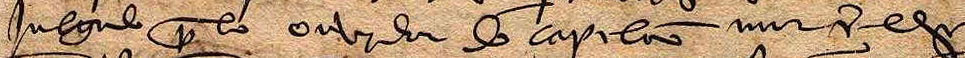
Julgado p̄lo ouvydor do capelaõ mor ē lhe
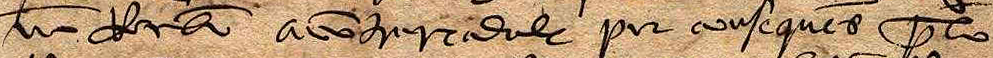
n̄o Receb̄r a cōtraryadade per consequēs p̄lo
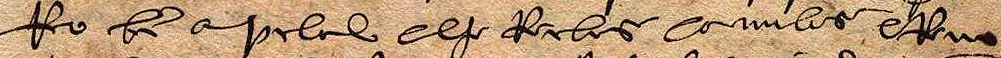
Reo bē apelado e lhe Recebese e anulase e Reuo
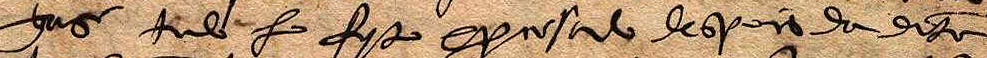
gase todo ho feyto e ꝓcesado despois da dita
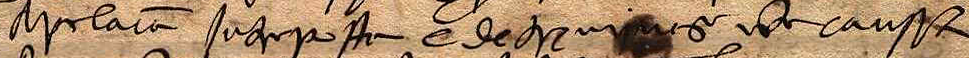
Apelaçā Jntreposta e detryminase esta caussa
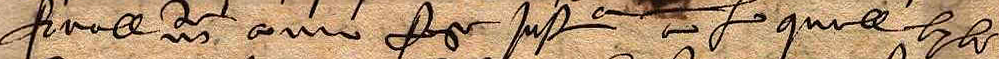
finallmte como fose Justa c̄o ho quall lybe
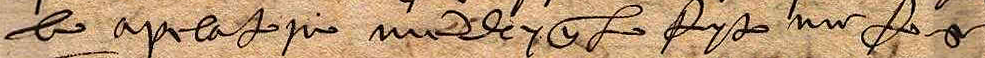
lo apelatorio mādey q̄ ho feyto me fose
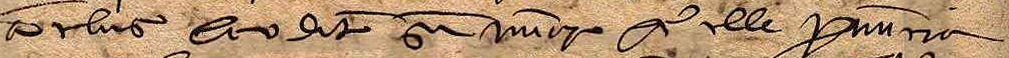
c̄ocluso e ao dito s̄or nūcyo e ē elle ꝓnūcia
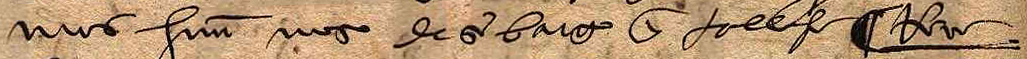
mos huū noso desēbargo q̄ tall he ¶ Rece
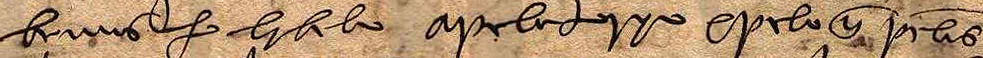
bemos ho ljbelo apelatoryo e pelo q̄ pelos
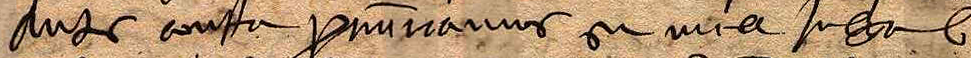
Autos consta ꝓnūciamos ser mall Julgado
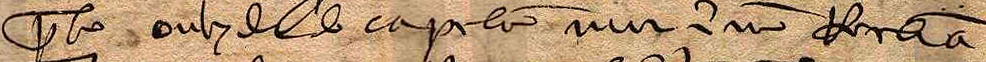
p̄lo ouvjdor do capelā mor ē nō Receb̄r a
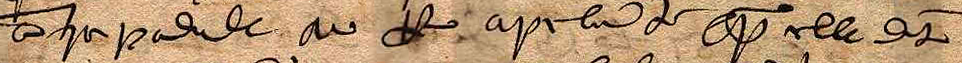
c̄otraryadade ao Reo apelāte e p̄o elle dito
